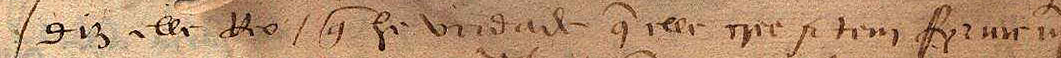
/ diz elle Reo / q̄ he verdade q̄ elle cree e tem fyrmemte
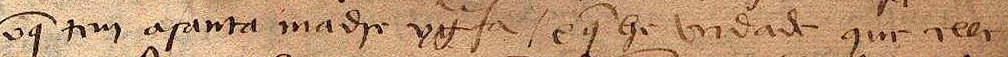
o q̄ tem a santa madre yḡJa / e q̄ he verdade que elle
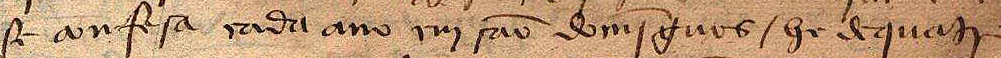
se confesa cada ano em são dom̄jguos / he de quatro
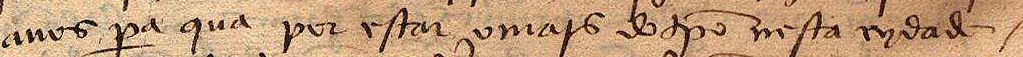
anos ꝑa qua por estar o majs do tp̄o nesta cydade /
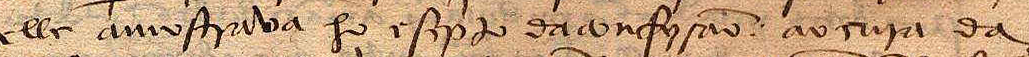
elle amostrava ho escpito da confysão : ao cura da
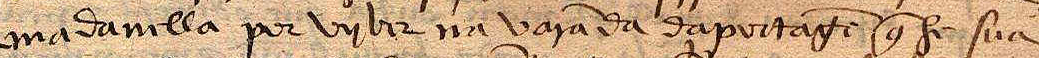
madanella por vyver na varāda da portaḡe q̄ he sua
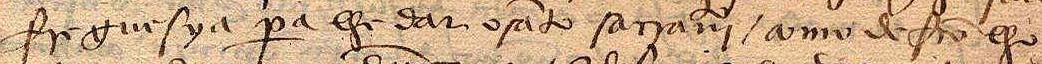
freguesya ꝑa lhe dar o s̄ato sacramto / como de fc̄o lho
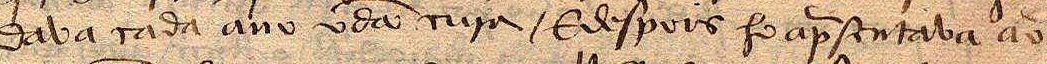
dava cada ano o d̄co cura / E despois ho ap̄sentava ao
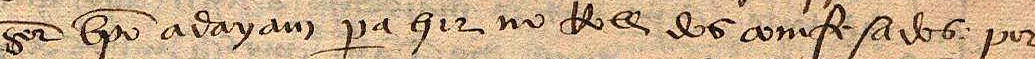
S̄or b̄po adayam ꝑa hir no Roll dos comfesados : por
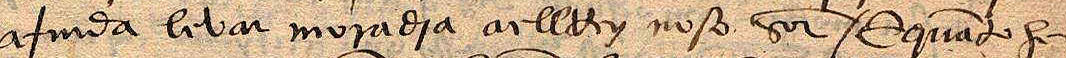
aJmda levar moradja a ell Rey noso S̄or / E qūato he
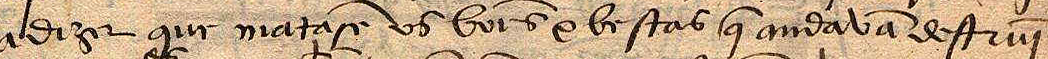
a dizer que matas̄e os bois e bestas q̄ andavā destrūj
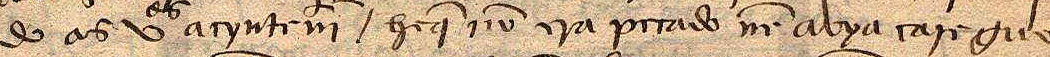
do as vas acyntemte / he q̄ nō era pecado n̄e avya careguo
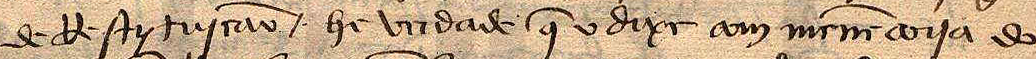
de Restytujcão /. verdade q̄ o dixe com men̄ecorja do
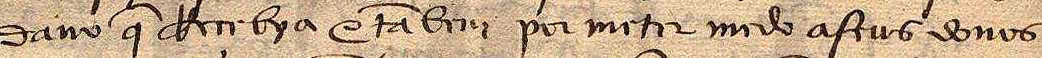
dano q̄ Reçebya e t̄abem por meter medo a seus donos
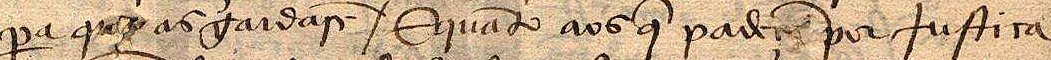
ꝑa que as gardas̄e / E quāto aos q̄ padeç̄e por Justica
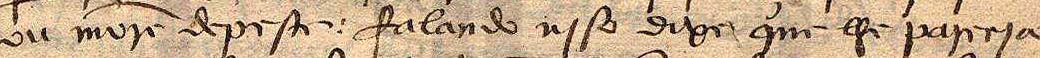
ou m̄ore de peste : falando njso dixe que lhe parecja
